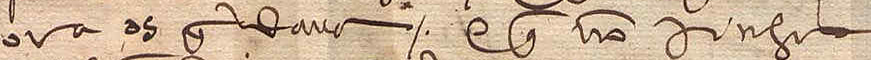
ora os grdaua /. e q̄ nō tinha
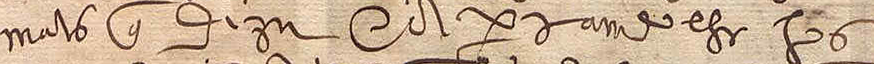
majs q̄ dizer e Aꝑtamdo lhe hos
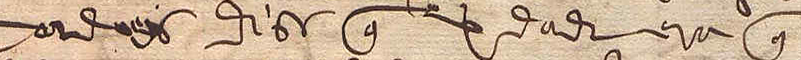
Cordoeys dise q̄ ꝟdade era q̄
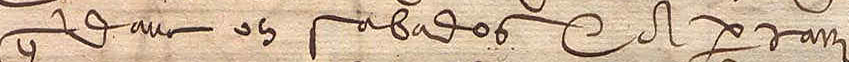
grdaua os sabados e Aꝑtam
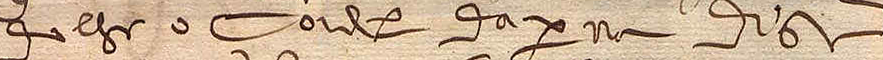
dolhe o Cordel da ꝑna dise
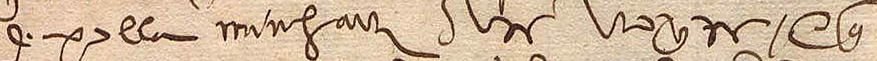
de polla minham Ate Noyte / e q̄
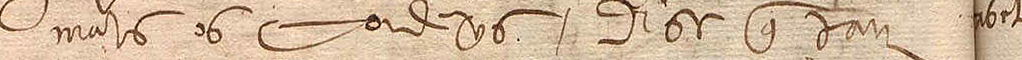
majs os cordeys / dise q̄ tam
